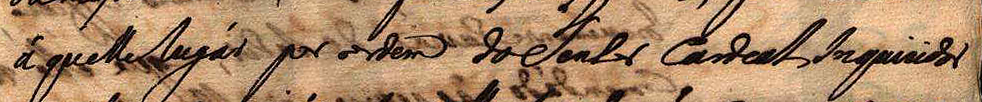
áquelle lugar por ordem do Senhor Cardeal Inquizidor
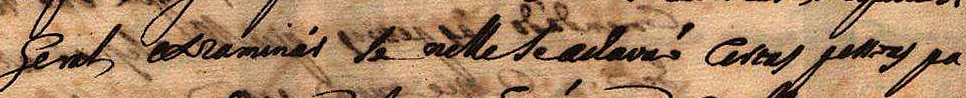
Geral exzaminar se nelle se achavaõ certas pessoas pa
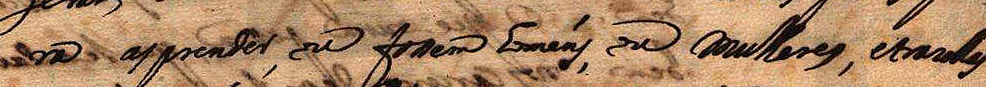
ra as prender, ou fossem homens, ou mulheres, e trazellas
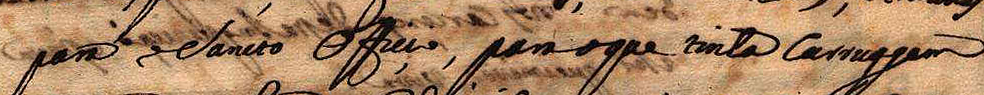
para o Sancto Officio, para o que tinha carruagem
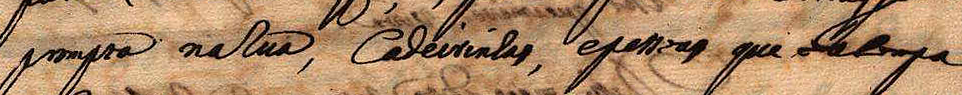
prompta na Rua, Cadeirinhas, e pessoas que o acompa
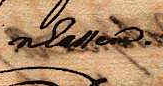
nhassem.
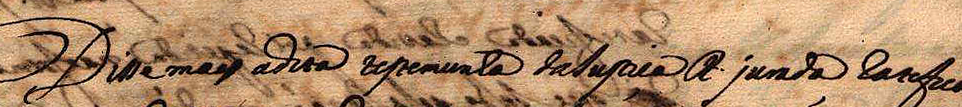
Disse mais a dita testemunha da Iustiça A jurada, Ratefica
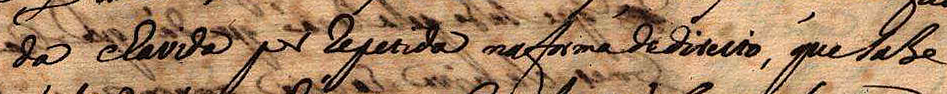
da e havida por Repetida na forma de direito, que sabe
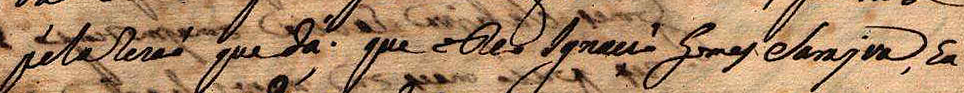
pela Rezaõ que dá: que o Reo Ignacio Gomes Sarajva, ha
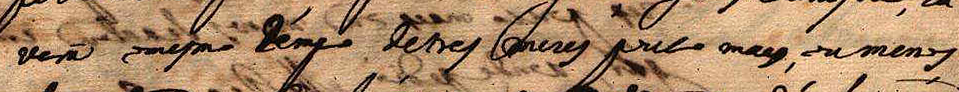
verá o mesmo tempo de tres mezes pouco mais, ou menos,
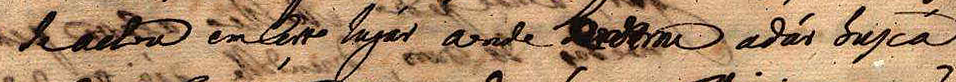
se achou em certo lugar aonde ordenou a dar busca
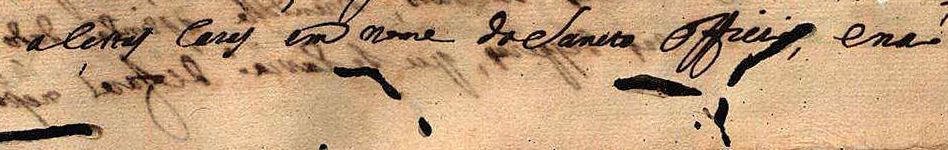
a certas cazas em nome do Sancto Officio, e naõ
